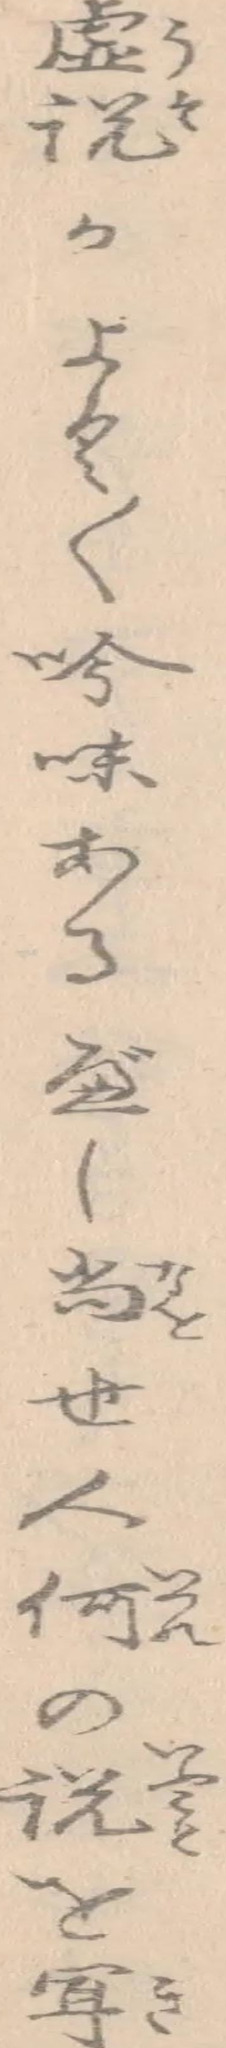虚説かよく〳〵吟味あるべし尚世人何の説を聞
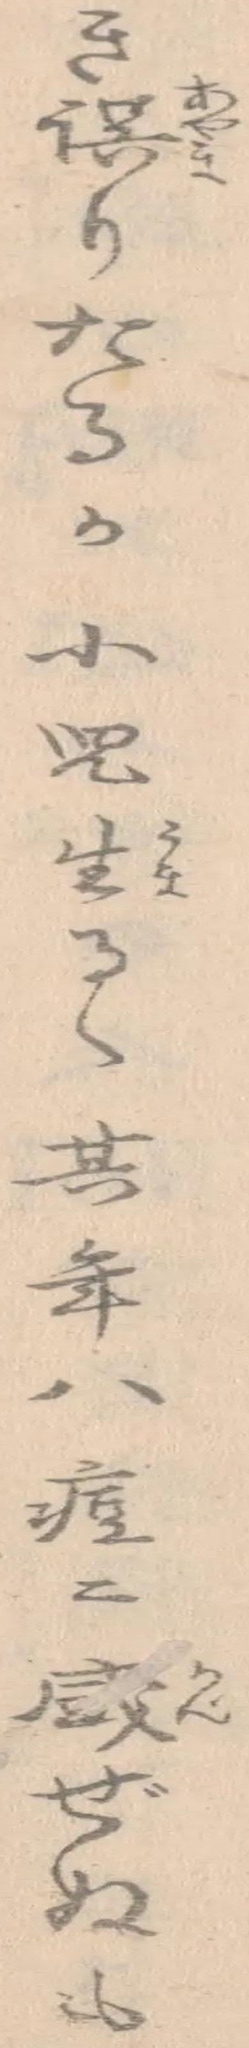き誤りたるか小児生るゝ其年は痘に感ぜぬも
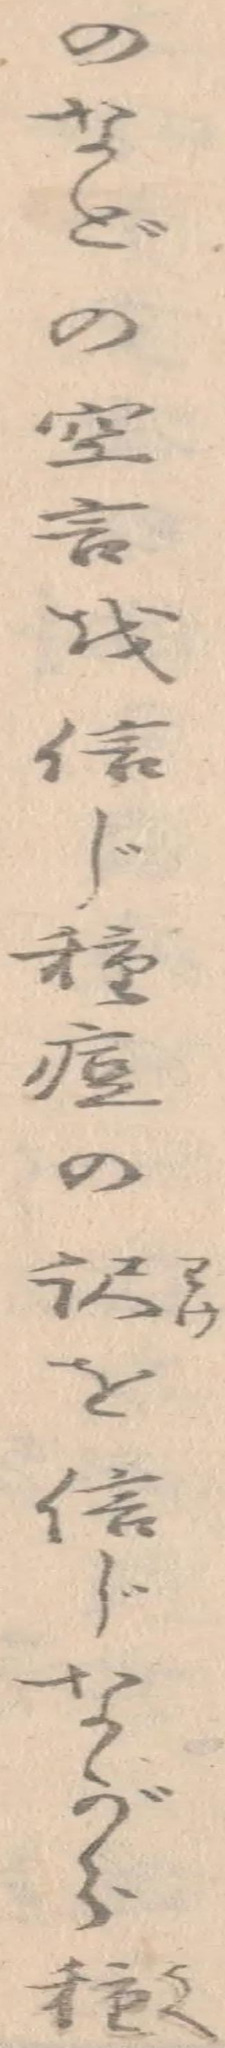のなどの空言を信じ種痘の訳を信じながら種
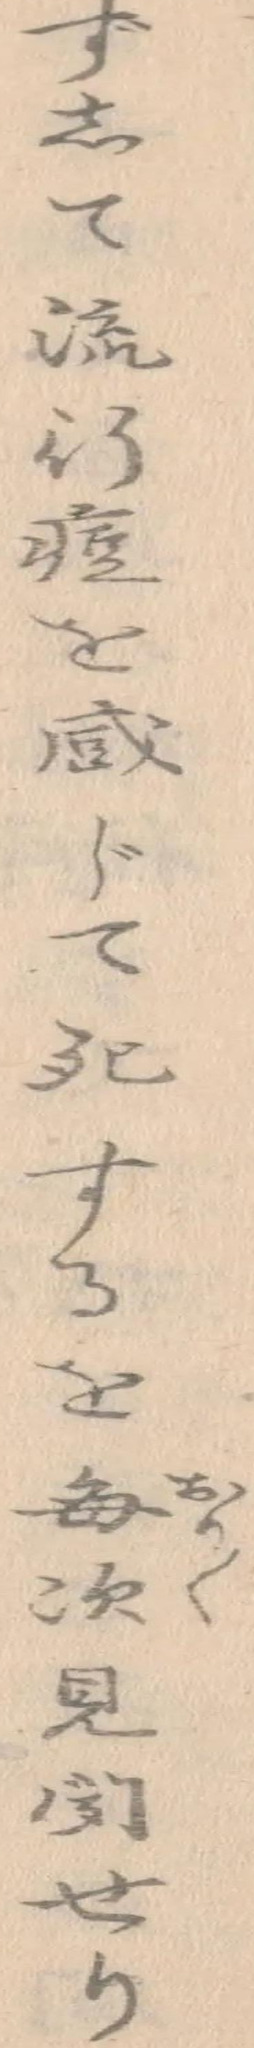ずして流行痘を感じて死するを毎次見聞きせり
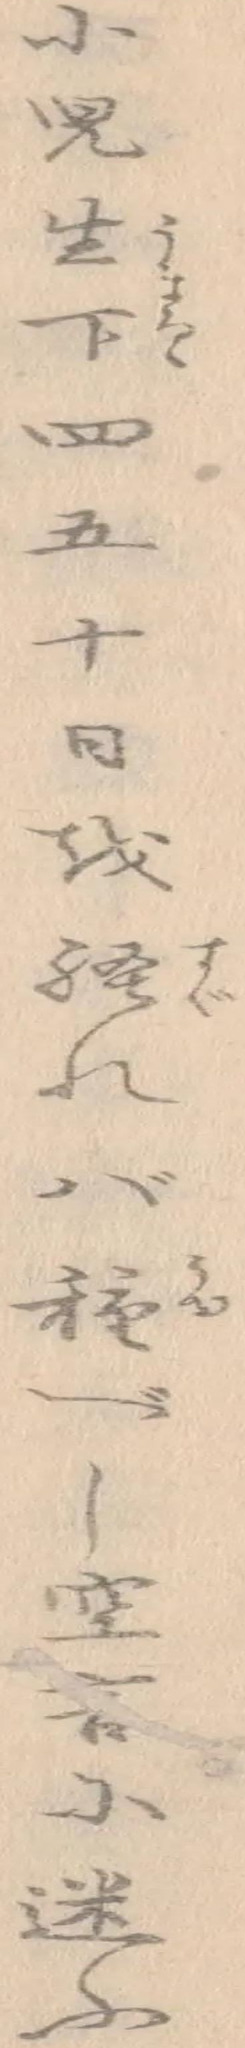小児生下四五十日を経れば種べし空言に迷ふ
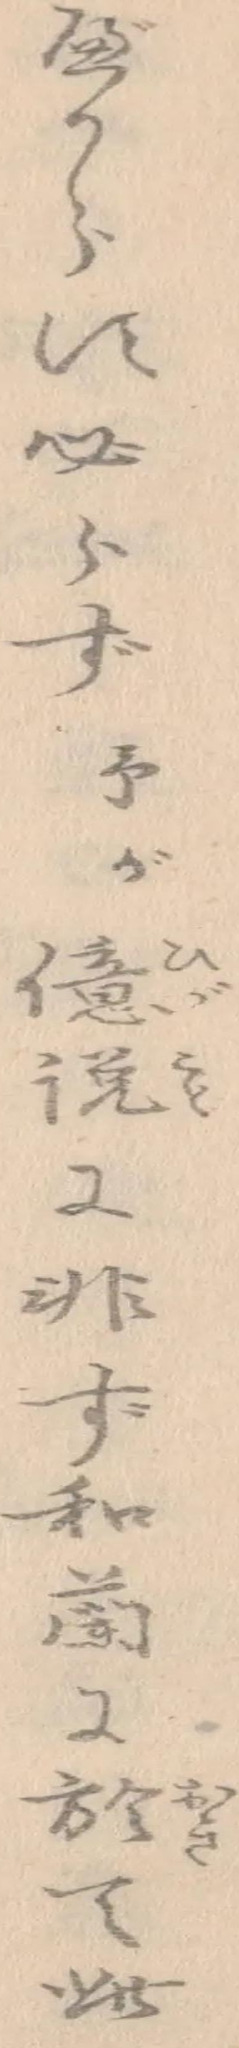べからす必らず予が億説に非ず和蘭に於て此
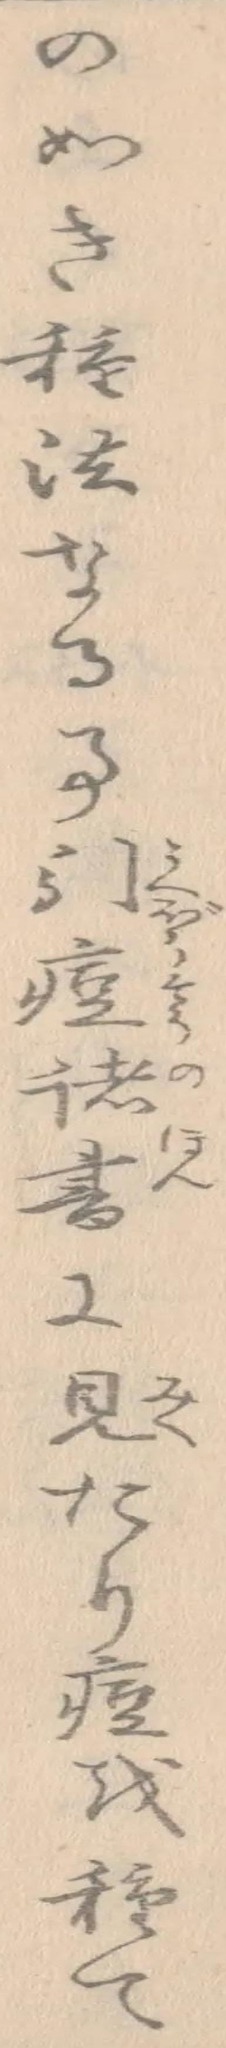の如き種法なる事引痘諸書に見たり痘を種て
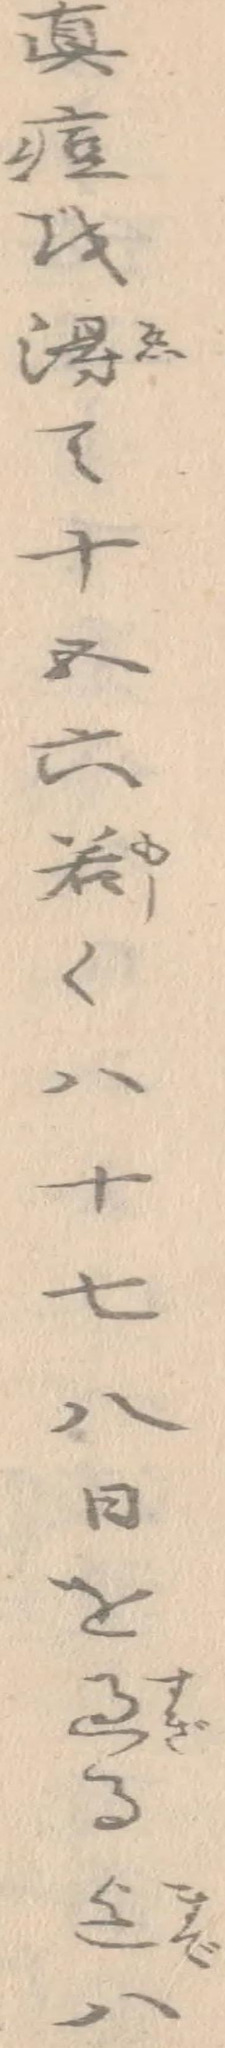真痘を得て十五六若くは十七八日を過る迄は
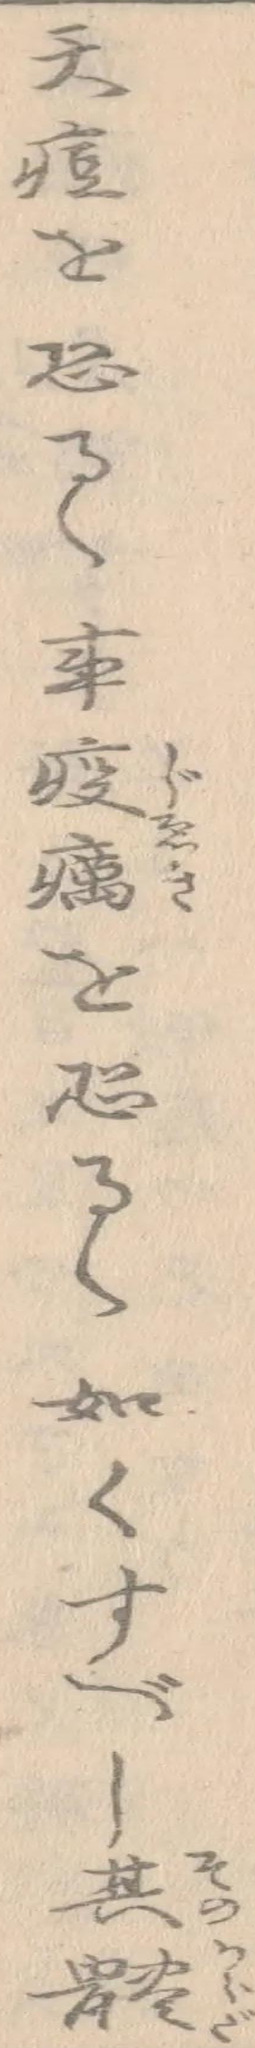天痘を恐るゝ事疫癘を恐るゝ如くすべし其体
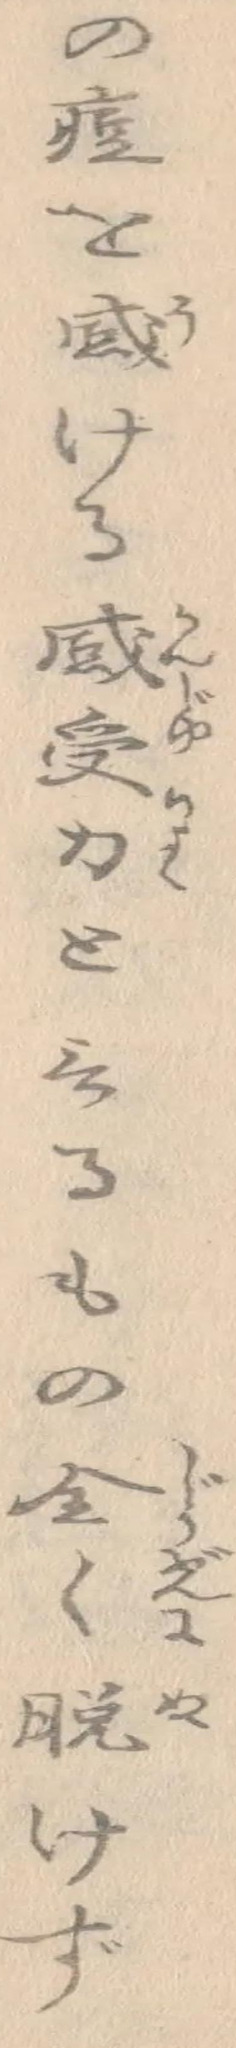の痘を感ける感受力と言るもの全く脱けず
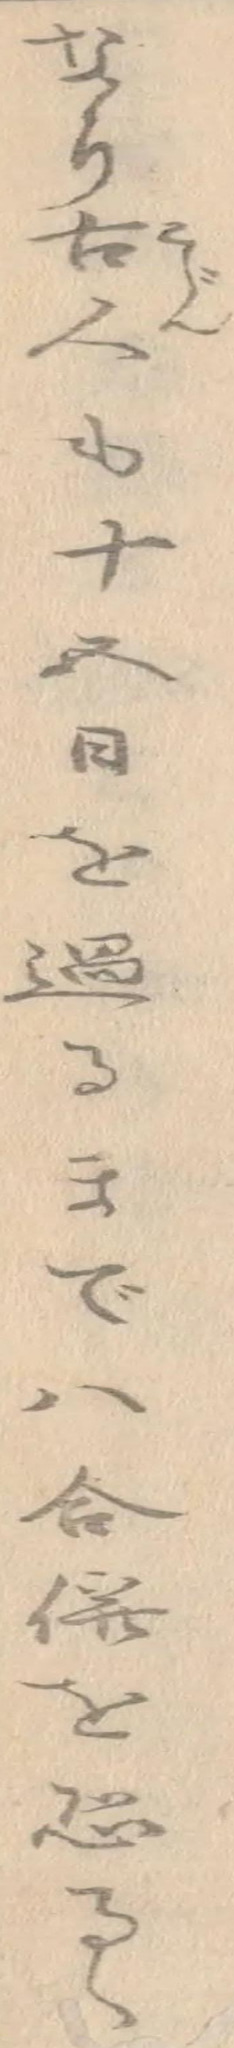なり古人も十五日を過るまでは合俗を恐るゝ
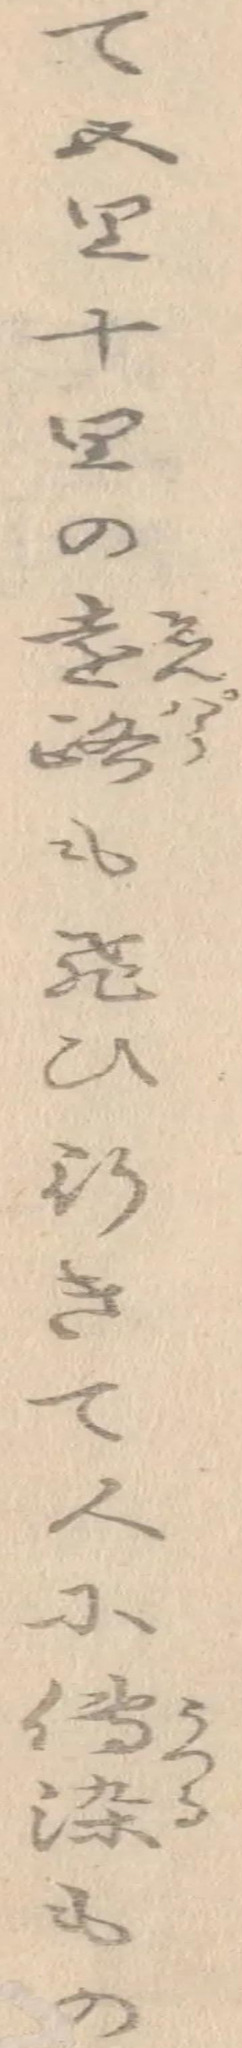て五里十里の遠路も飛ひ行きて人に伝染もの

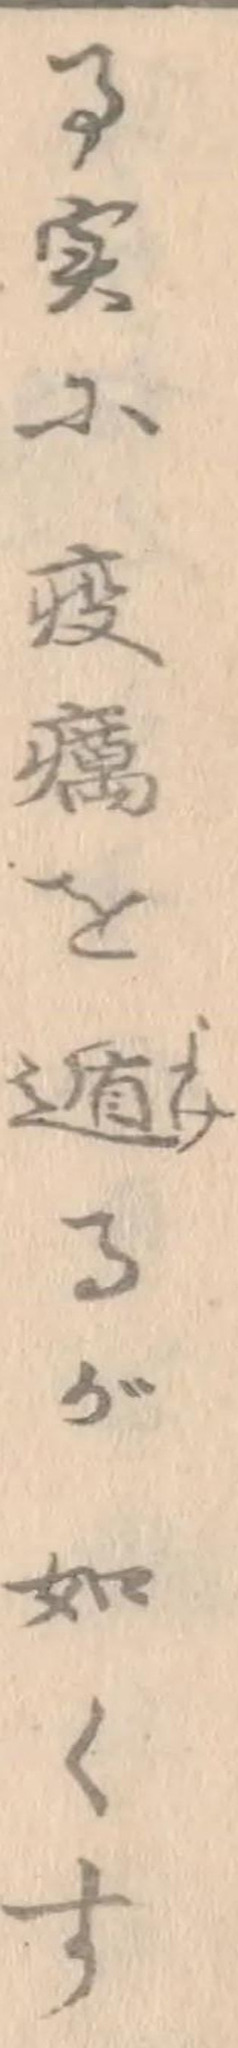る実に疫病を遁るが如くす
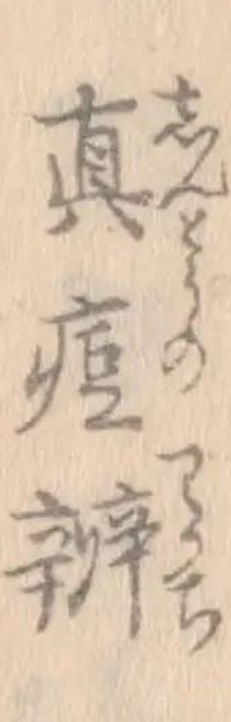真痘弁
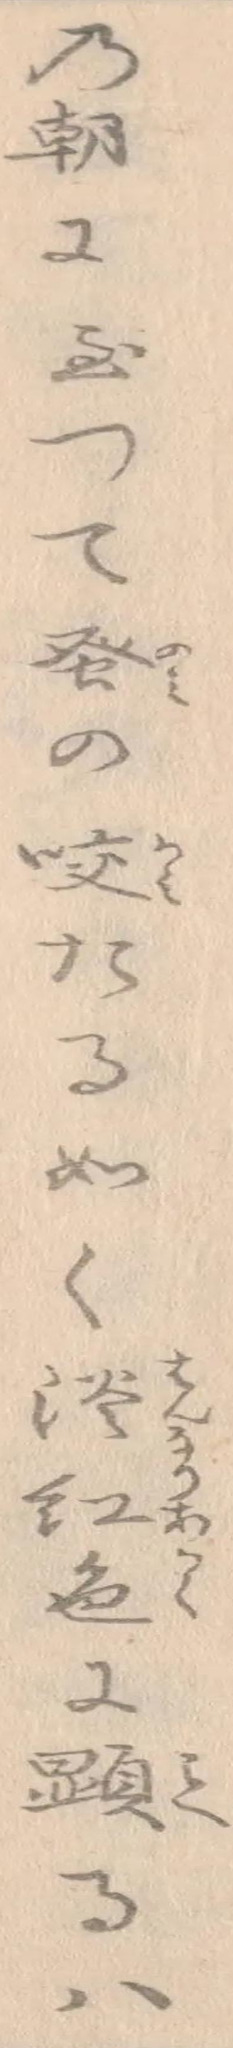の朝に至つて蚤の咬たる如く淡紅色に顕るは
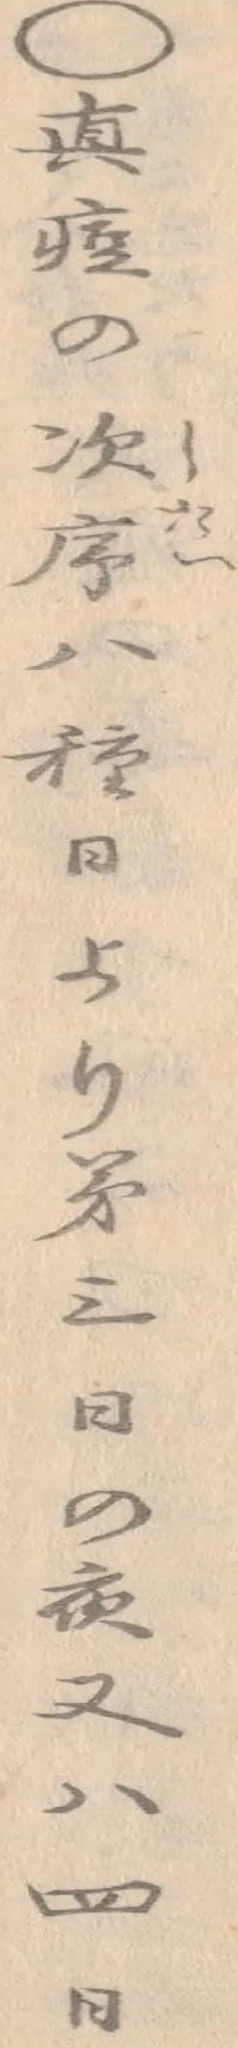○真痘の次序は種日より第三日の夜又は四日
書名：散花養生訓
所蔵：国立国会図書館 National Diet Library, JAPAN
